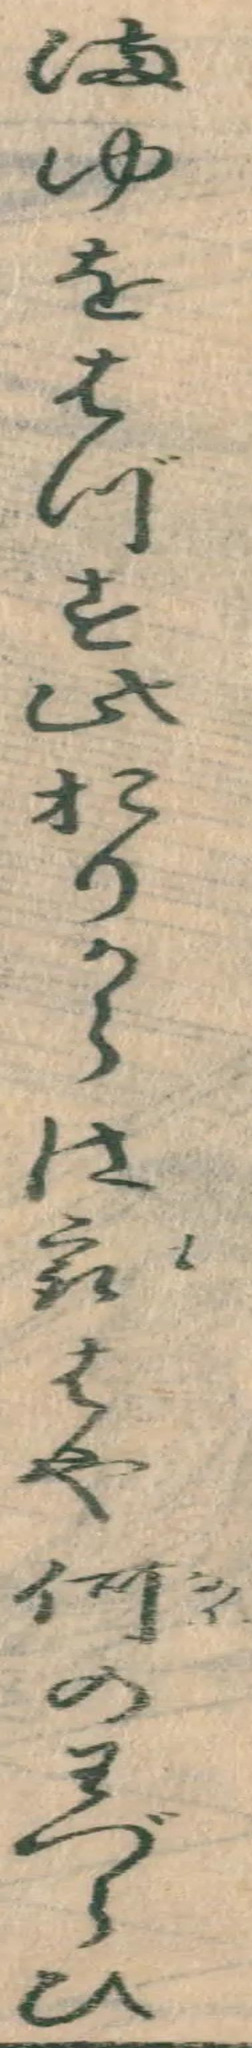まゆをはづす此おりからは最はや何のわづらひ
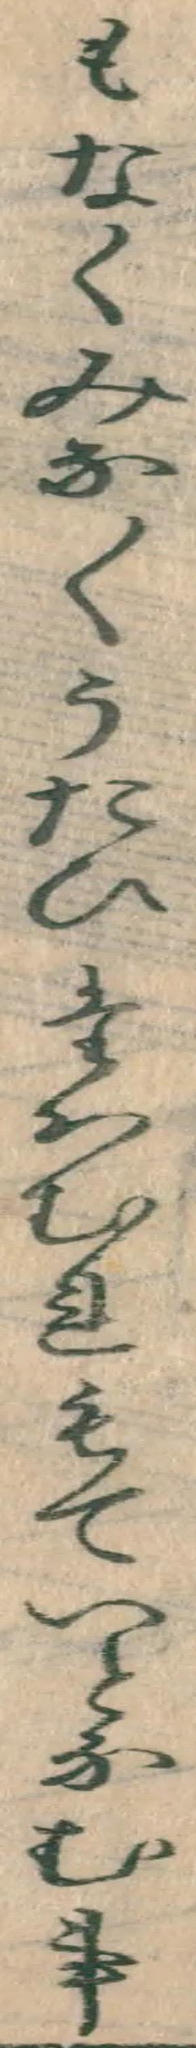もなくみな〳〵うたひたはむれもていとなむ事
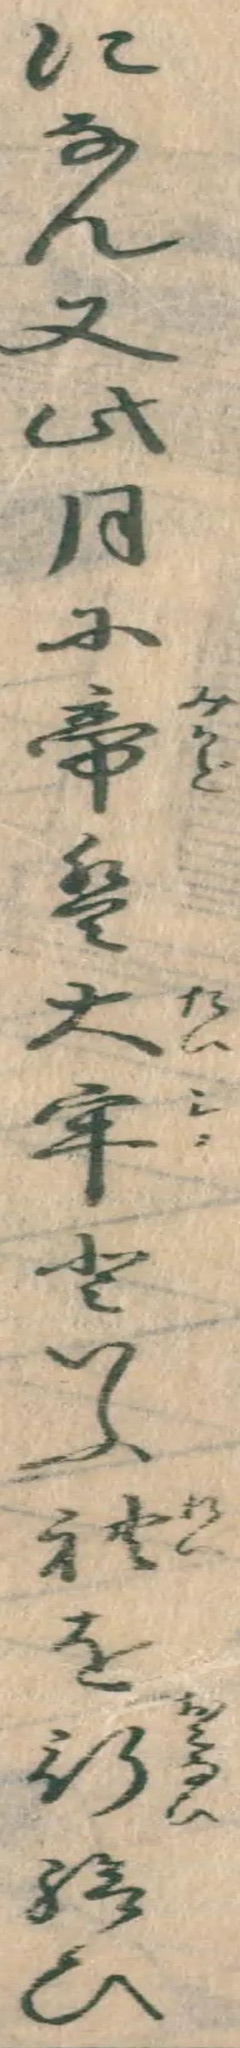になん又此月に帝は大牢といふ礼を行給ひ
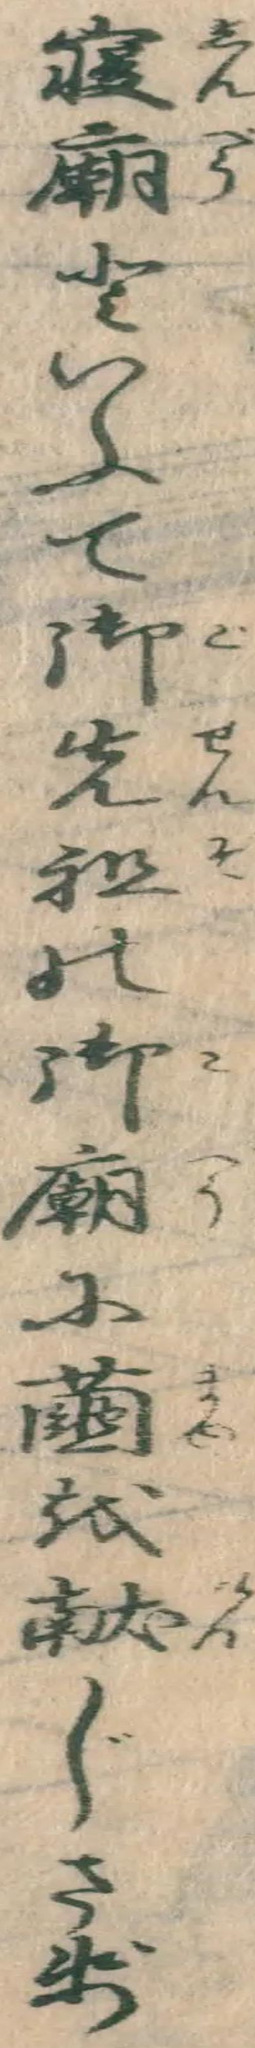寝廟といふて御先祖の御廟に繭を献じさせ
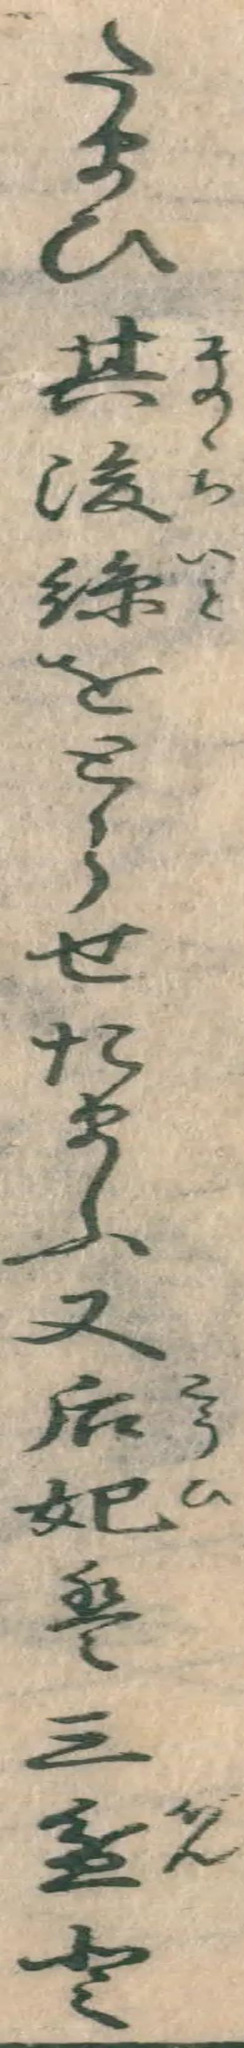たまひ其後糸をとらせたまふ又后妃は三盆と
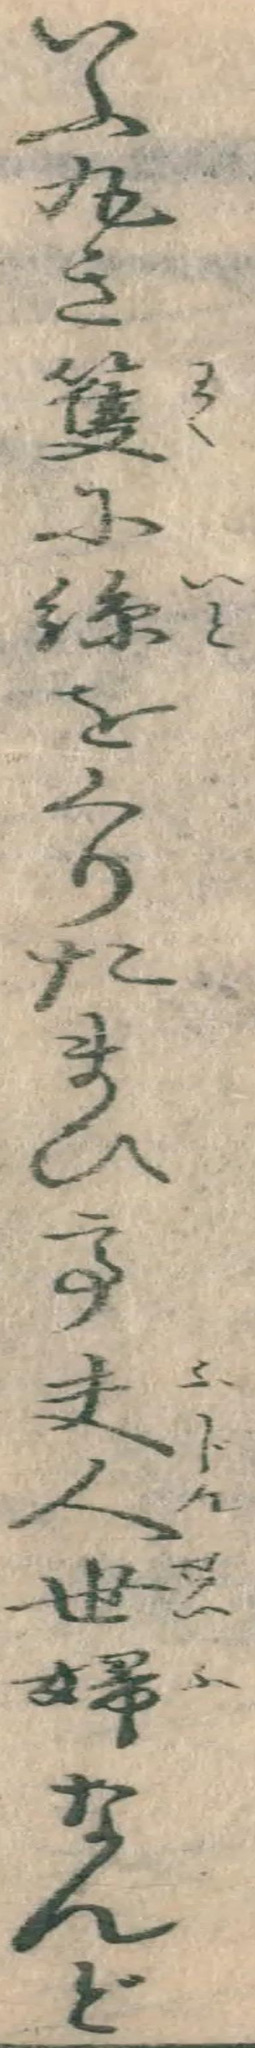いふ丸き篗に糸をくりたまひて夫人世婦なんど
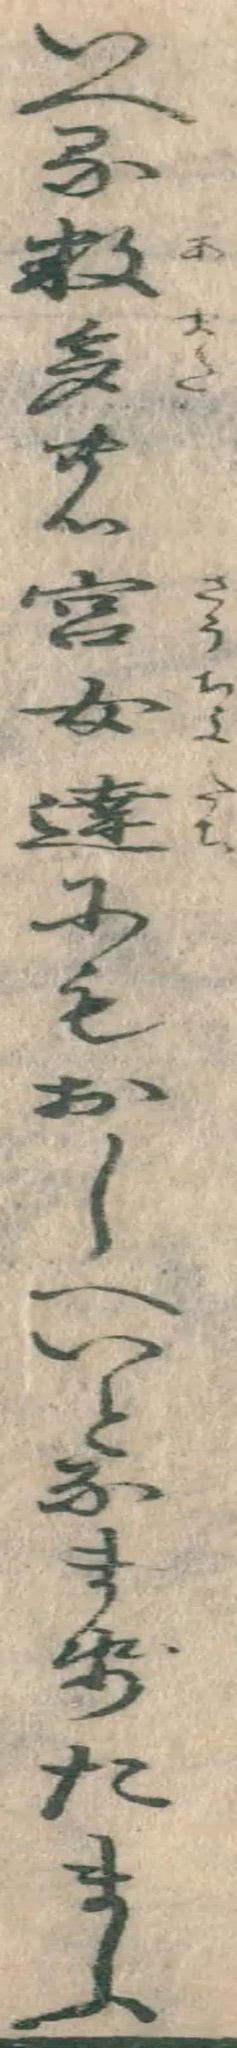いへる数多の宮女達にもおしへいとなませたまふ
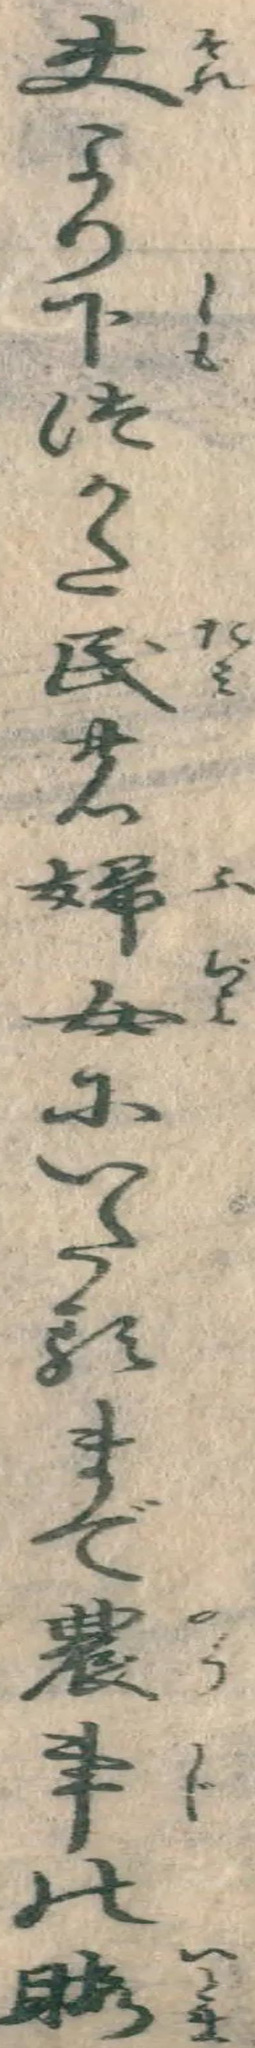夫より下つかた民の婦女にいたるまで農事の暇
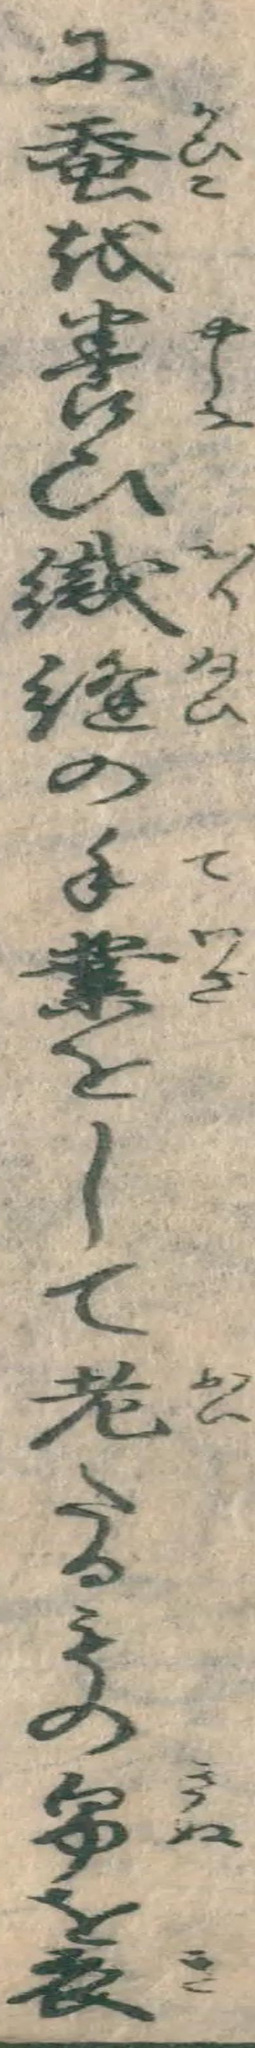に蚕を養ひ織縫の手業をして老たるもの帛を衣
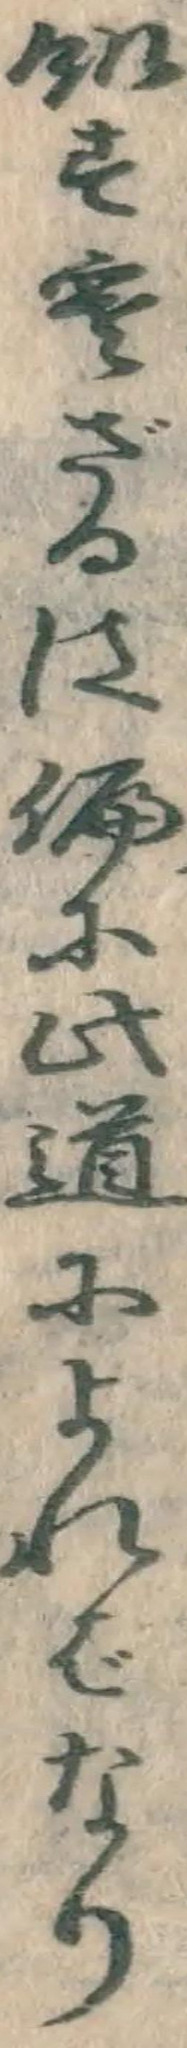飢す寒ざるは偏に此道によればなり

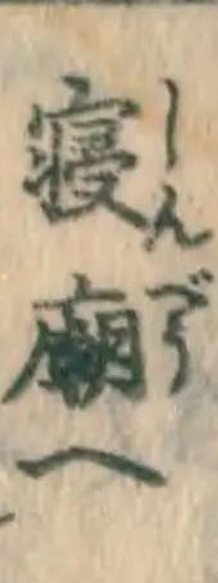寝廟へ
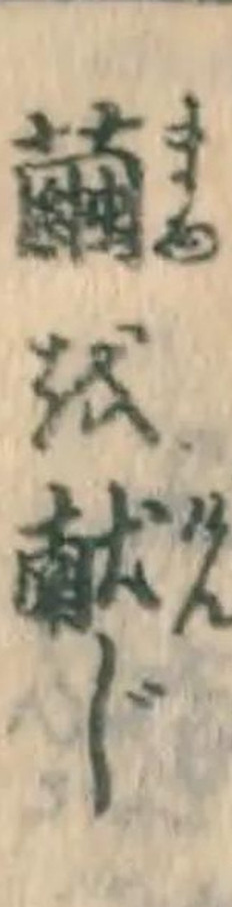繭を献じ
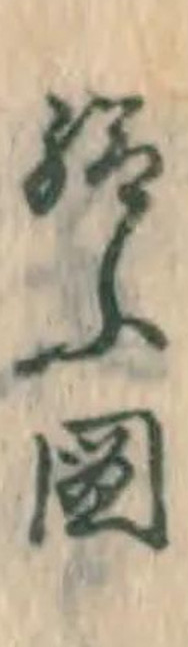給ふ図

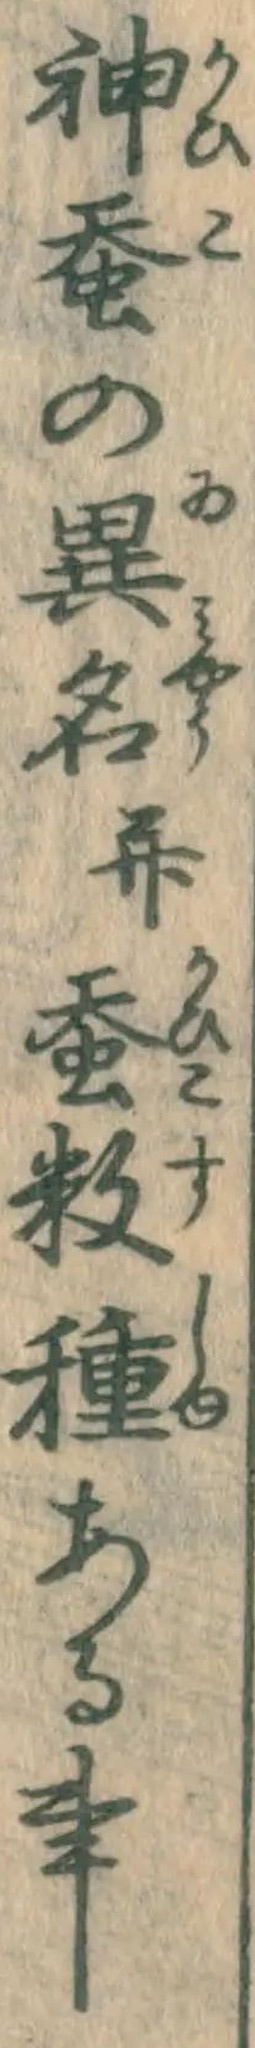神蚕の異名并蚕数種ある事
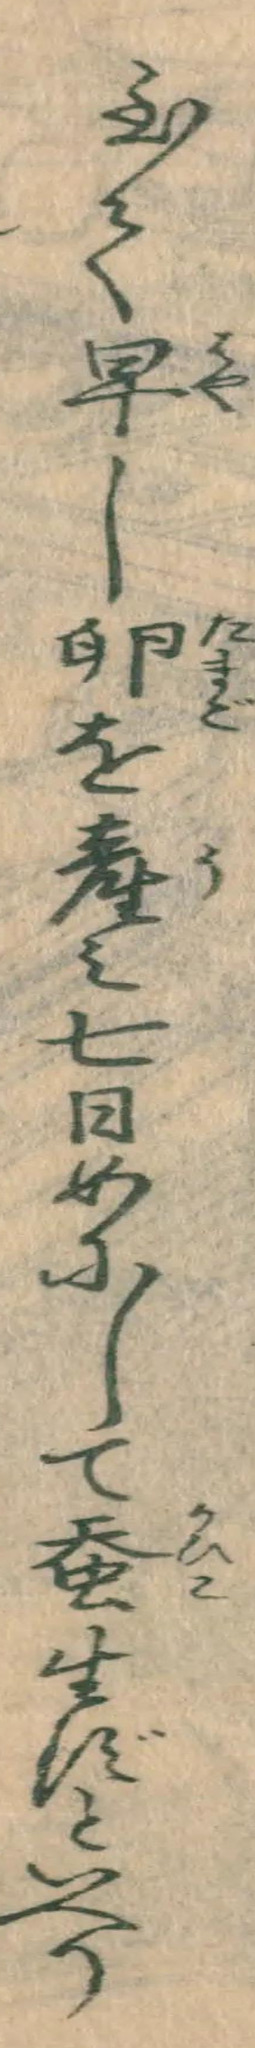至て早しし卵を産み七日めにして蚕生ずといへり
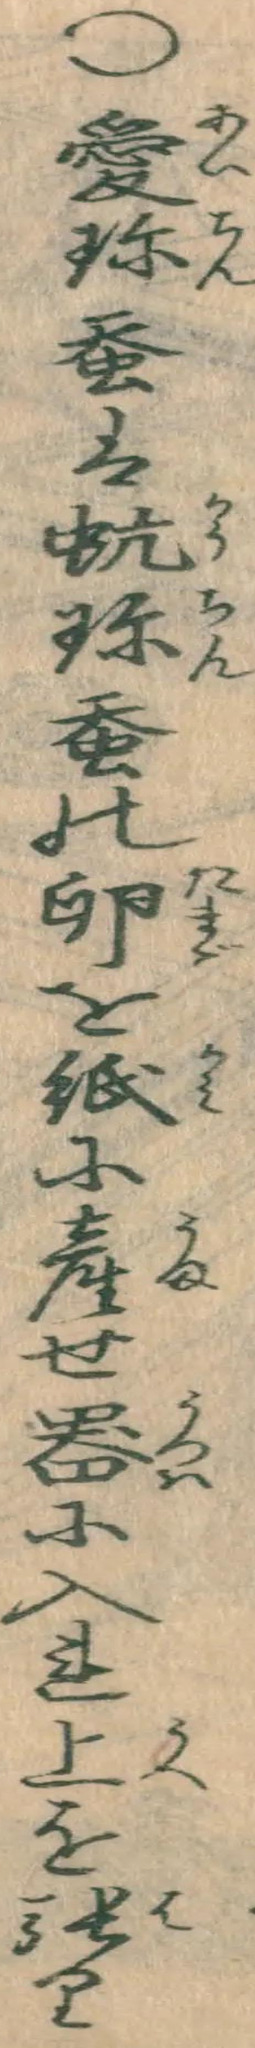○愛珍蚕は蚢珍蚕の卵を紙に産せ器に入れ上を張り
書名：養蚕秘録 3巻. [1]
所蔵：国立国会図書館 National Diet Library, JAPAN
